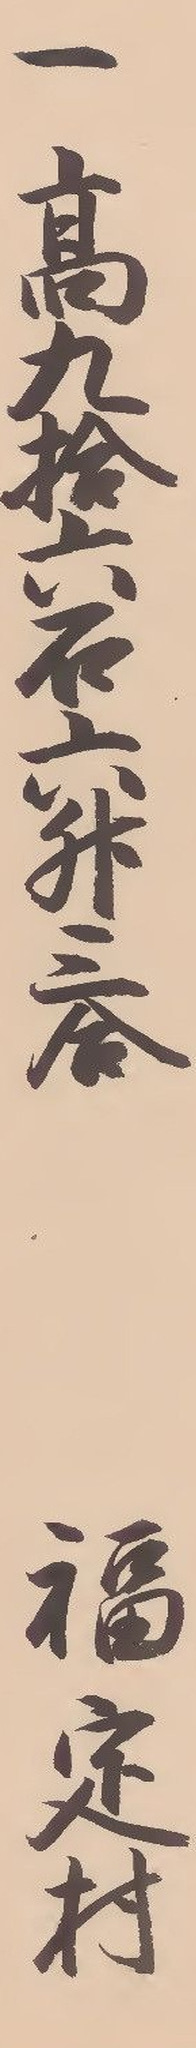一高九拾六石六升三合福定村

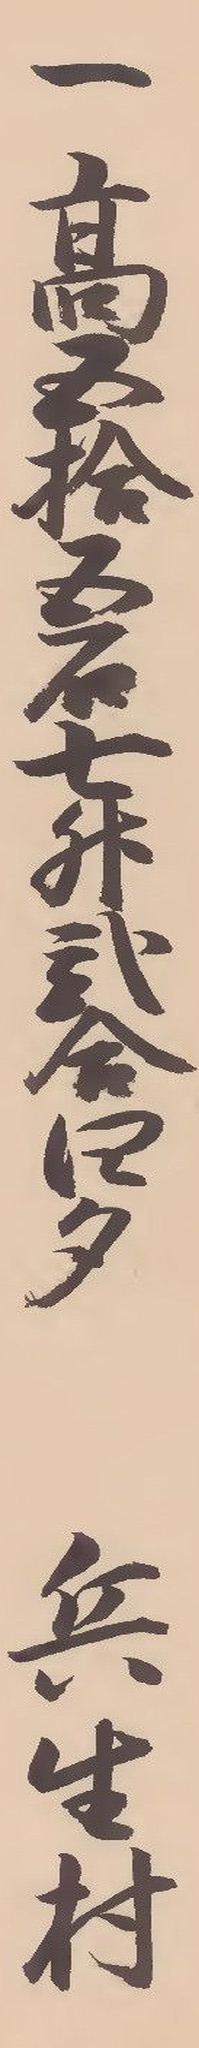一高五拾五石七升弐合四勺兵生村
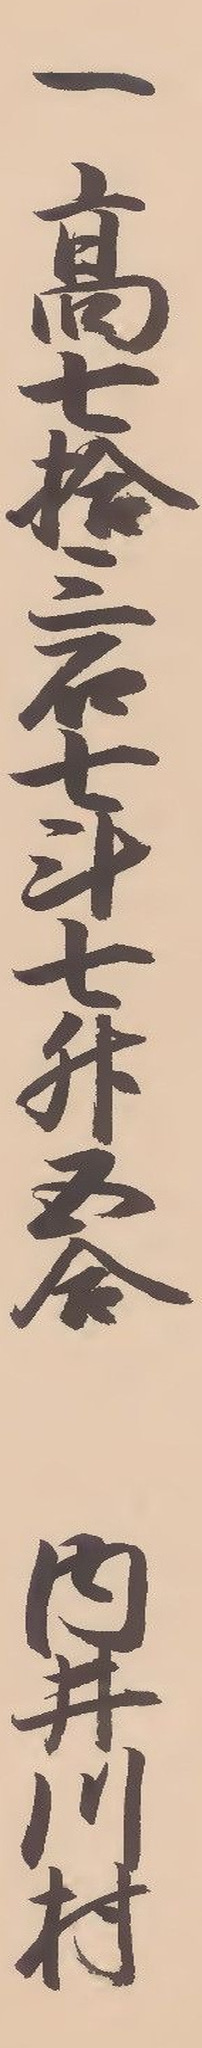一高七拾三石七斗七升五合内井川村
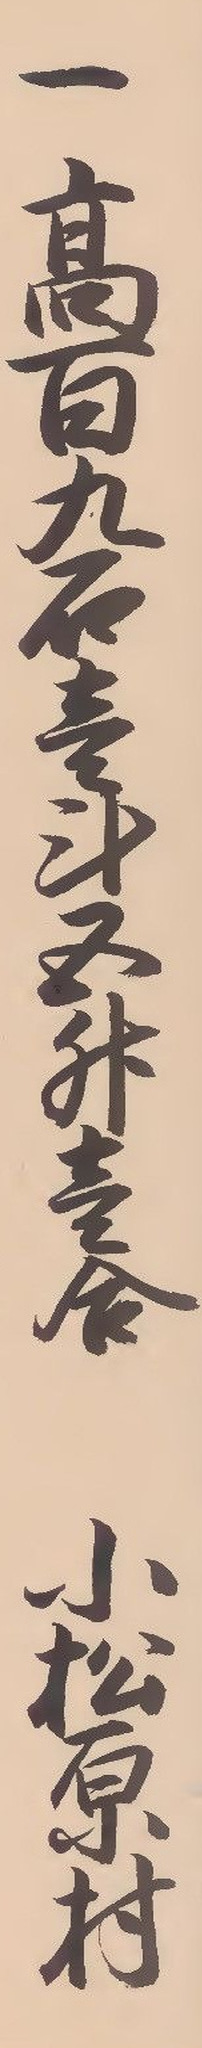一高百九石壱斗五升壱合小松原村
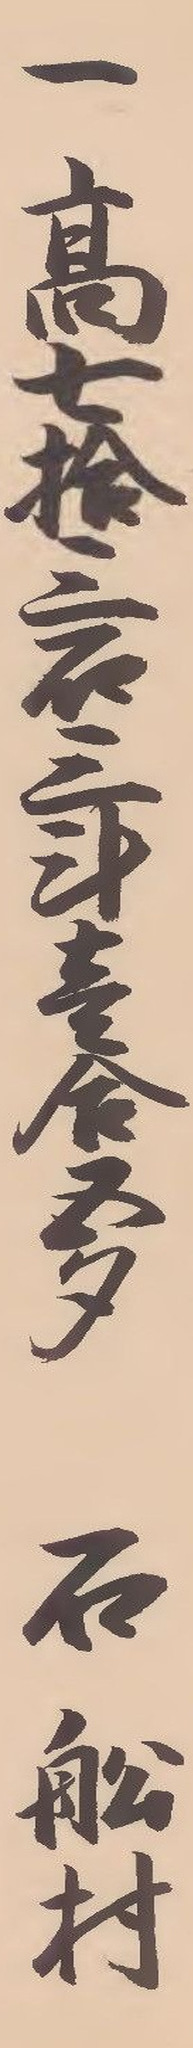一高七拾三石三斗壱合五勺石船村
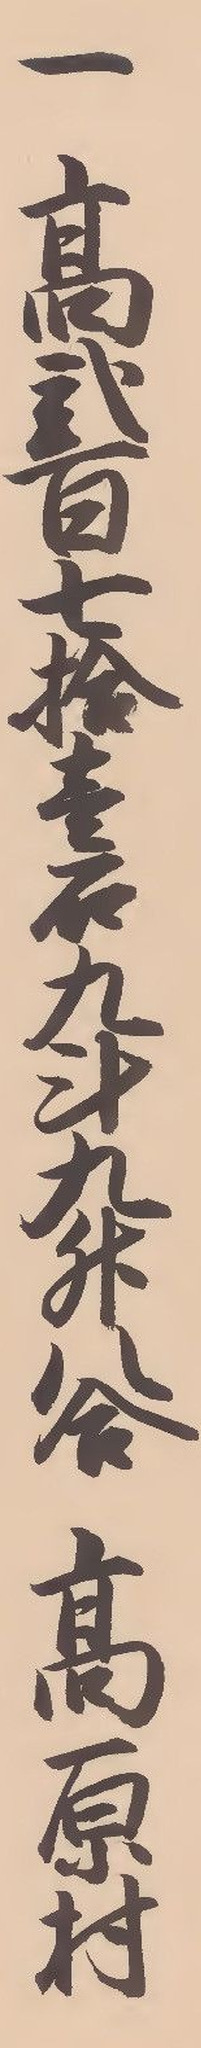一高弐百七拾壱石九斗九升八合高原村
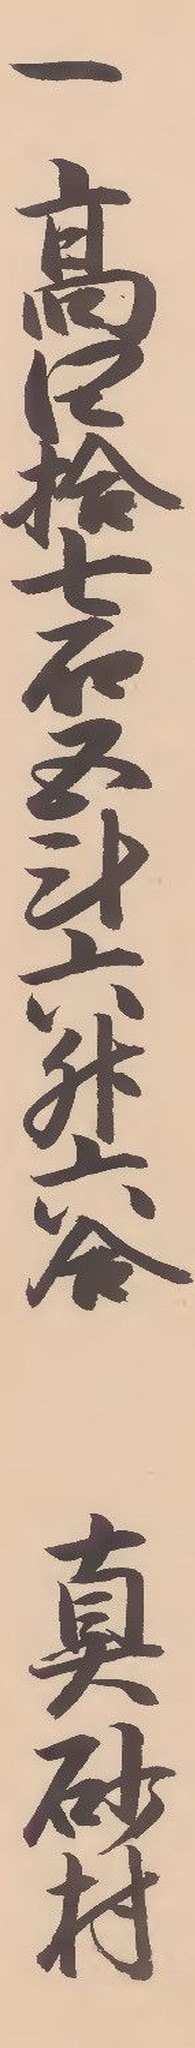一高四拾七石五斗六升六合真砂村

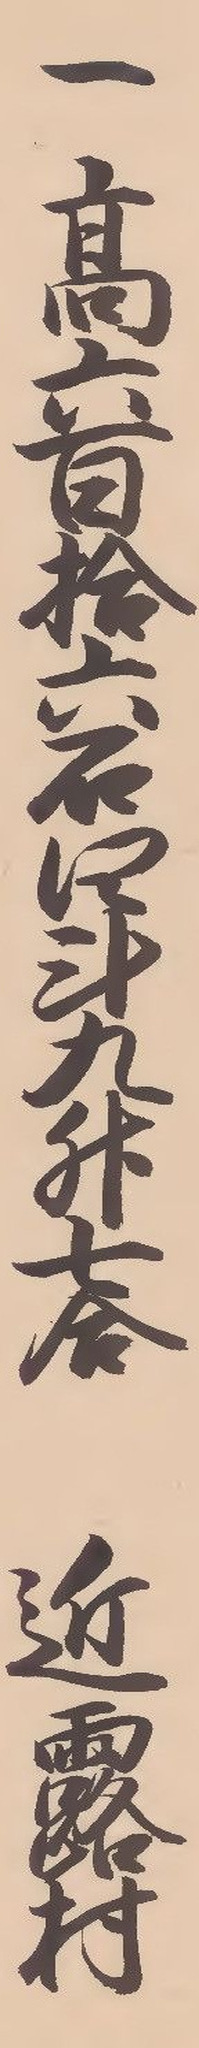一高六百拾六石四斗九升七合近露村
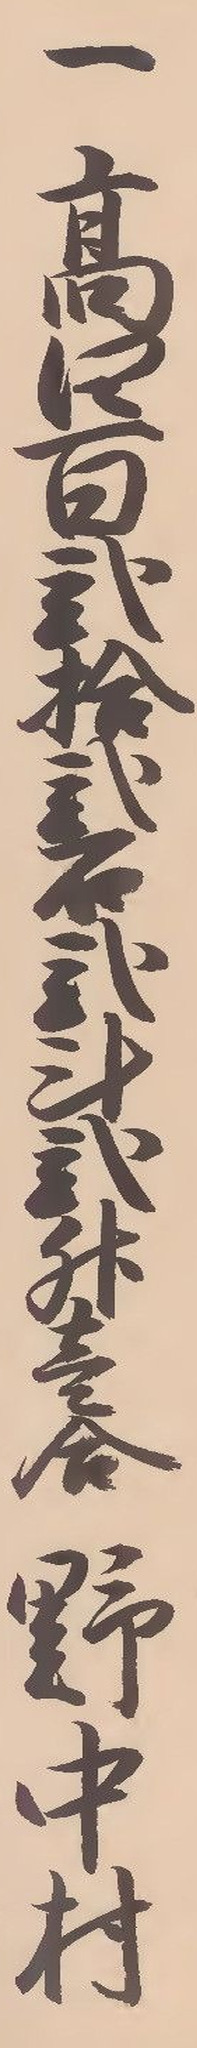一高四百弐拾弐石弐斗弐升壱合野中村
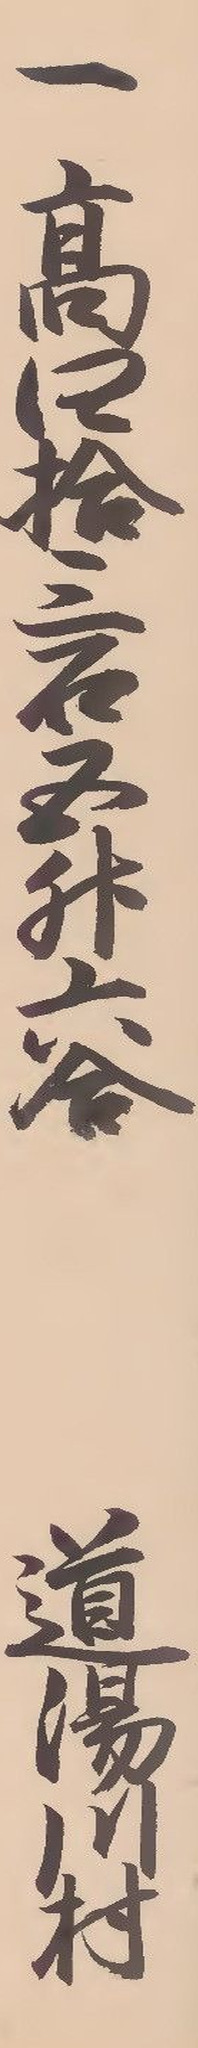一高四拾三石五升六合道湯川村
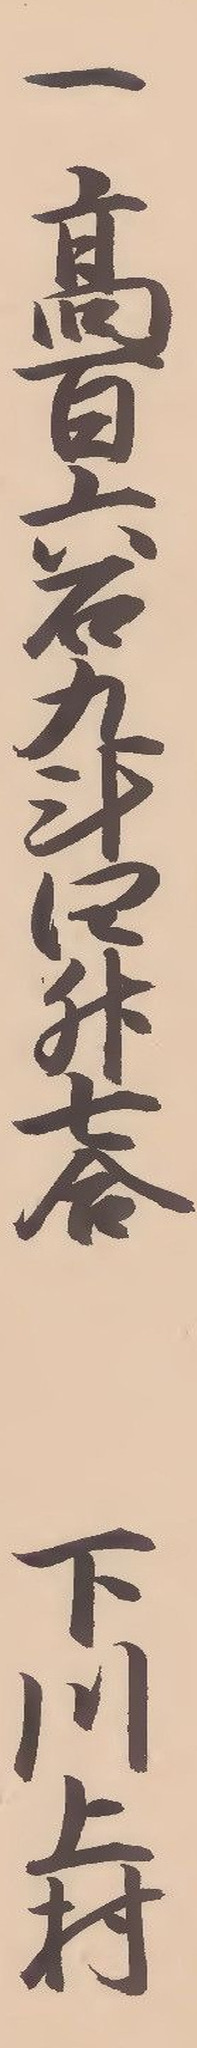一高百六石九斗四升七合下川上村

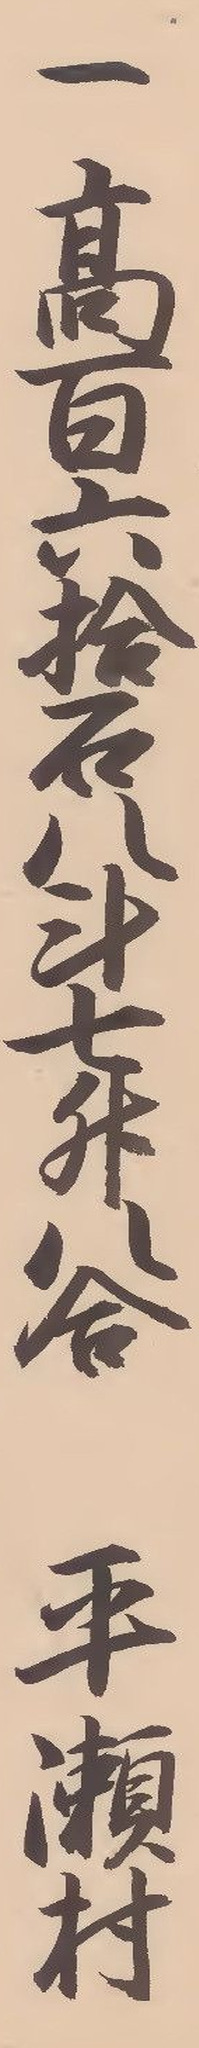一高百六拾石八斗七升八合平瀬村
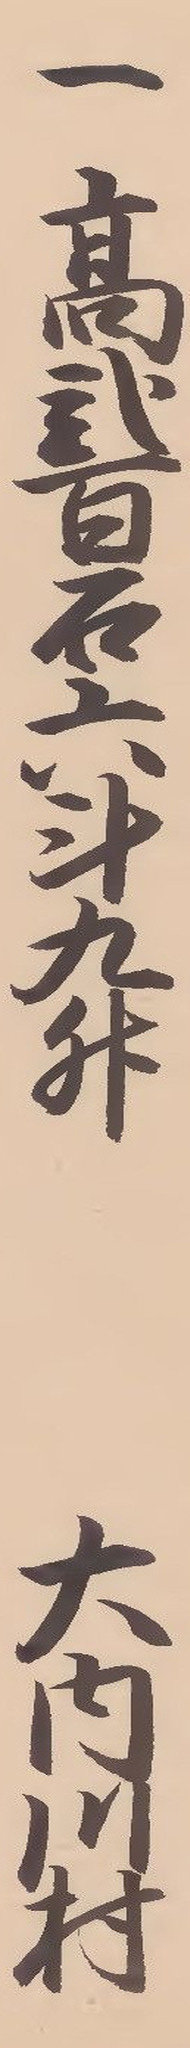一高弐百石六斗九升大内川村
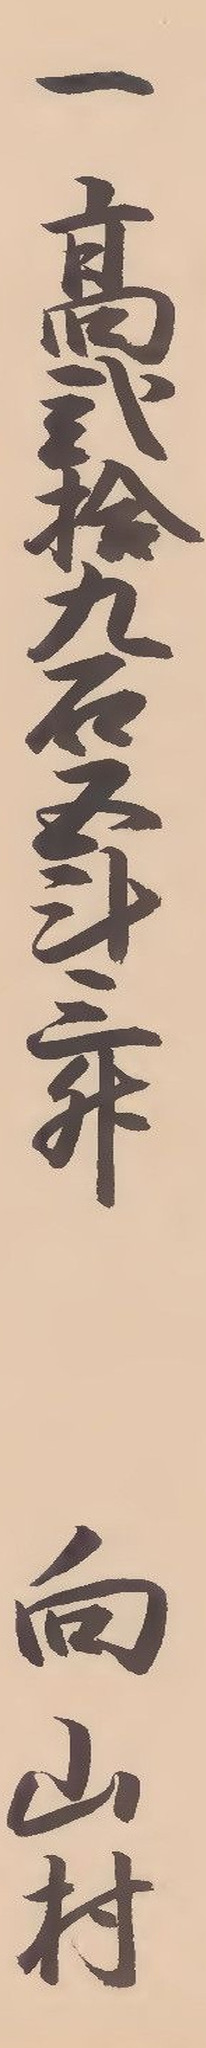一高弐拾九石五斗三升向山村
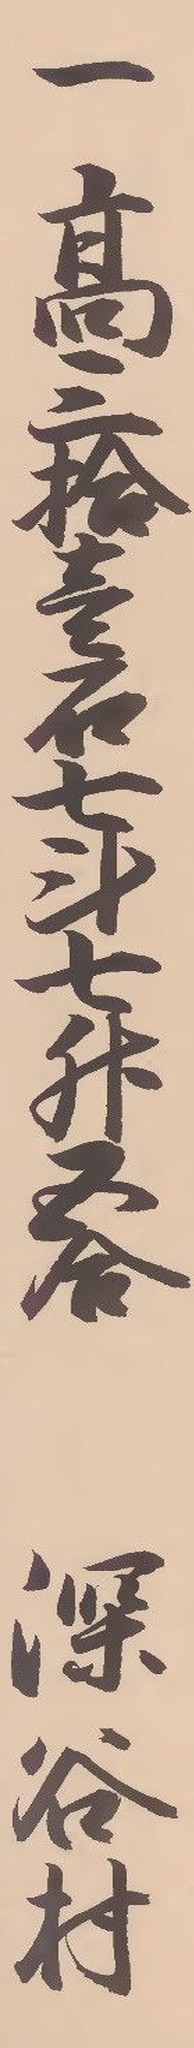一高三拾壱石七斗七升五合深谷村
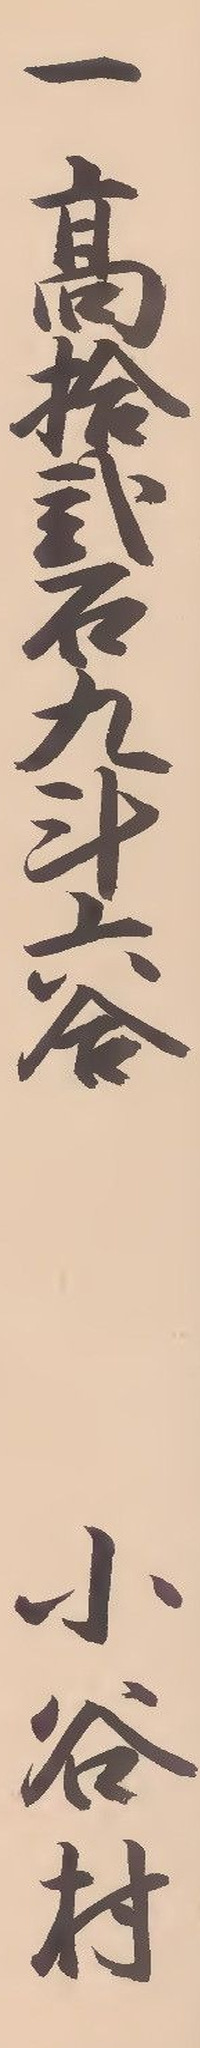一高拾弐石九斗六合小谷村
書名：紀伊国郷帳
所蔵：国立公文書館 National Archives of Japan
